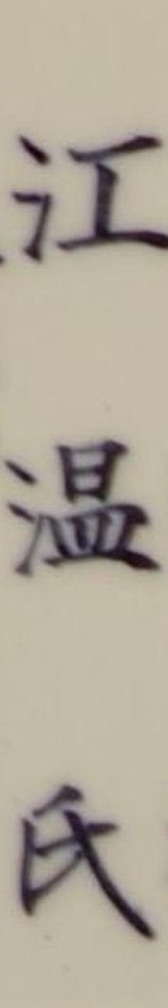江温氏
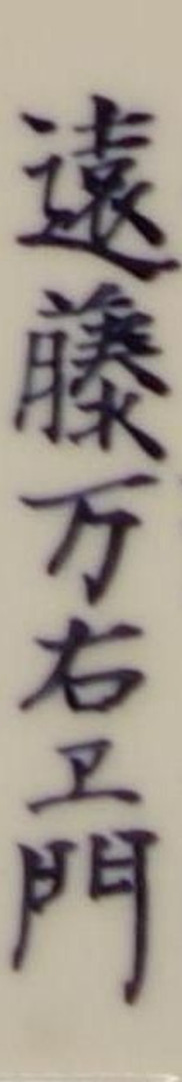遠藤万右ヱ門
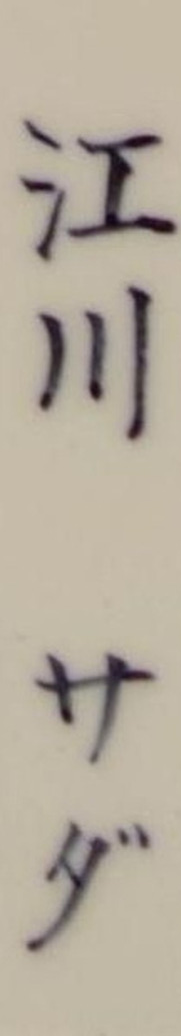江川サダ
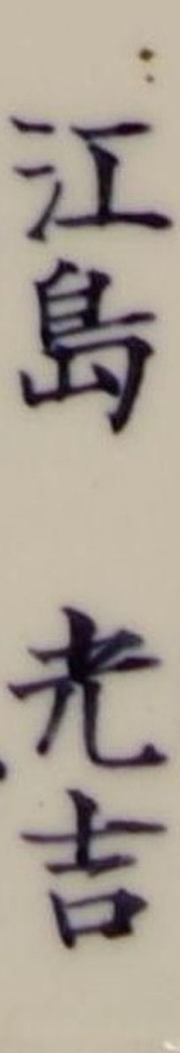江島光吉
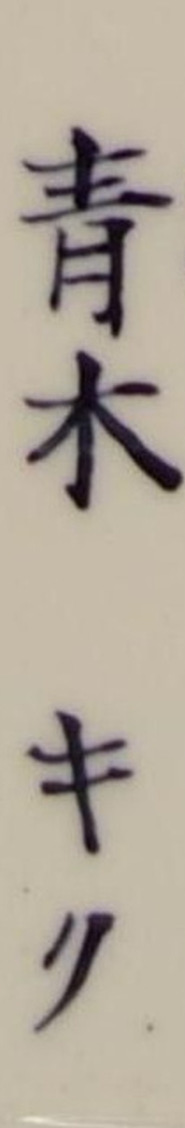青木キク
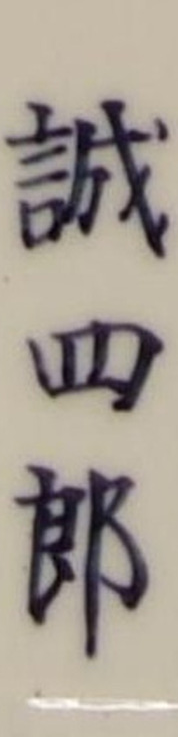誠四郎
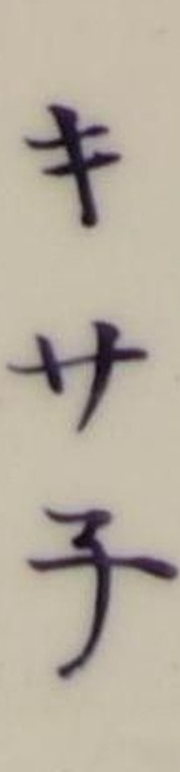キサ子
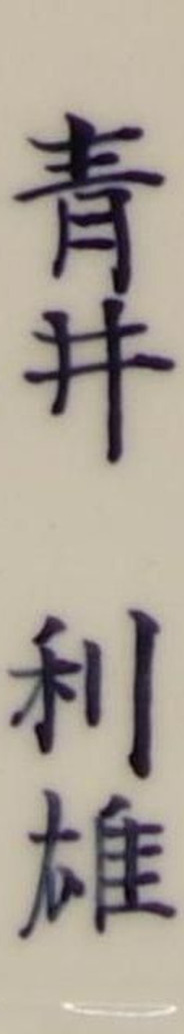青井利雄
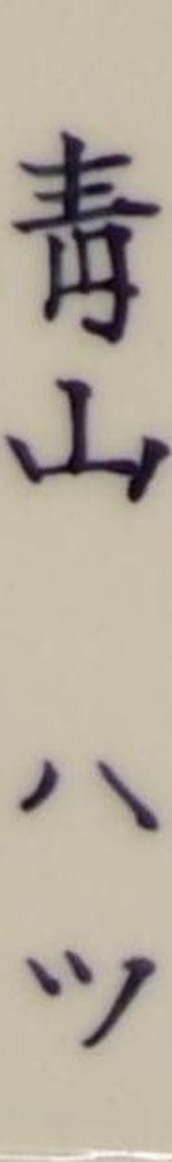青山ハツ
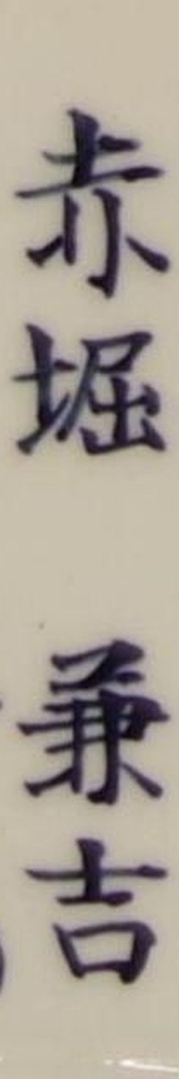赤堀兼吉

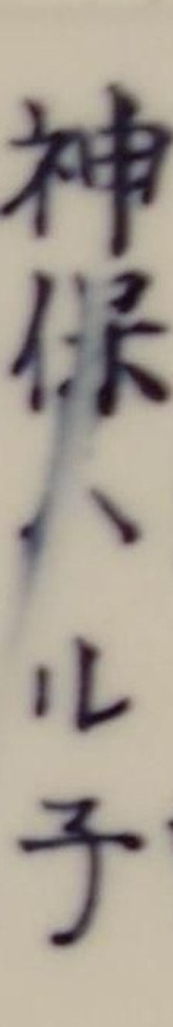神保ハル子
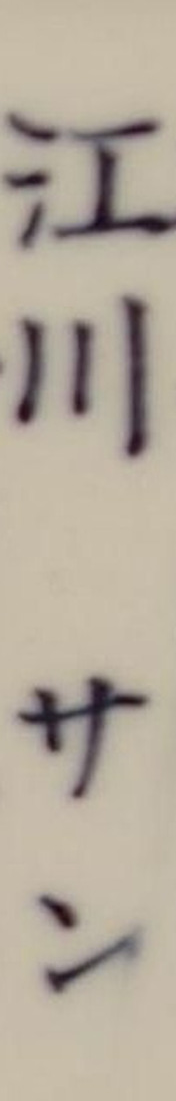江川サン
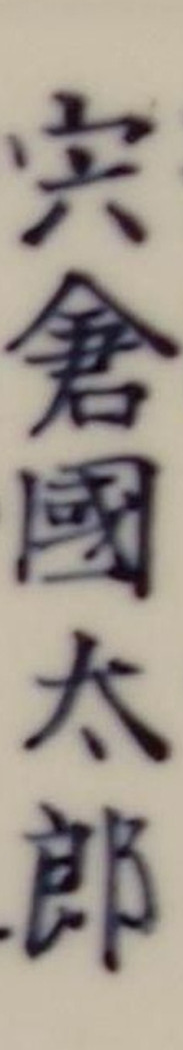宍倉国太郎
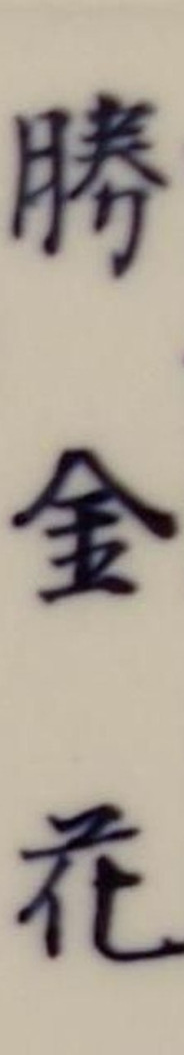勝金花
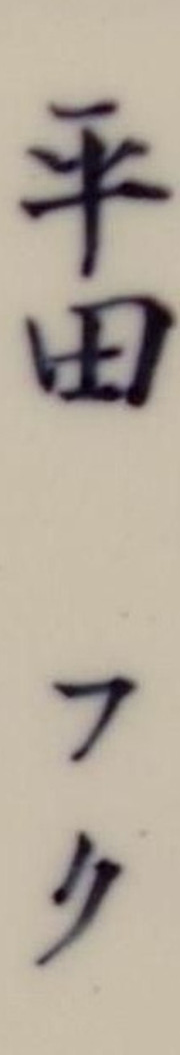平田フク
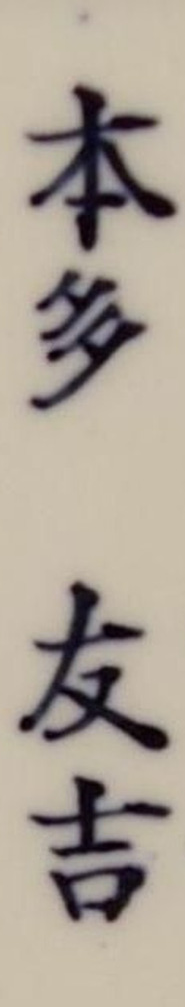本多友吉
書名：M~S
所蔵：高野山金剛峯寺
